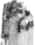五
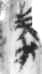麋
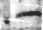一
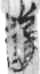○（巂）
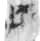四
